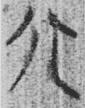北
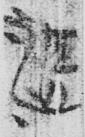洍（頤）
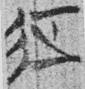征
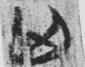凶
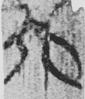六
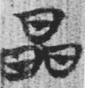晶
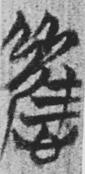○（弗）
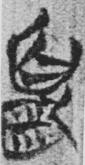頤
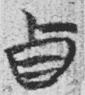貞
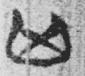凶
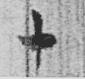十
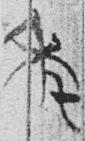年
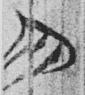勿
